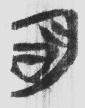明
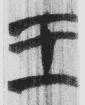王
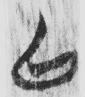㠯（以）
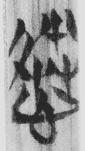{人𠔉心}
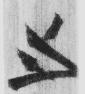之
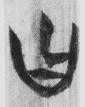曰
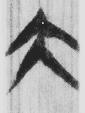大
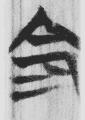命
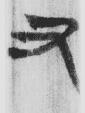又
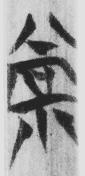常
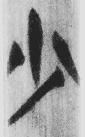少
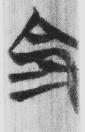命
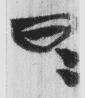日=
